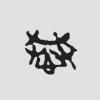恭
